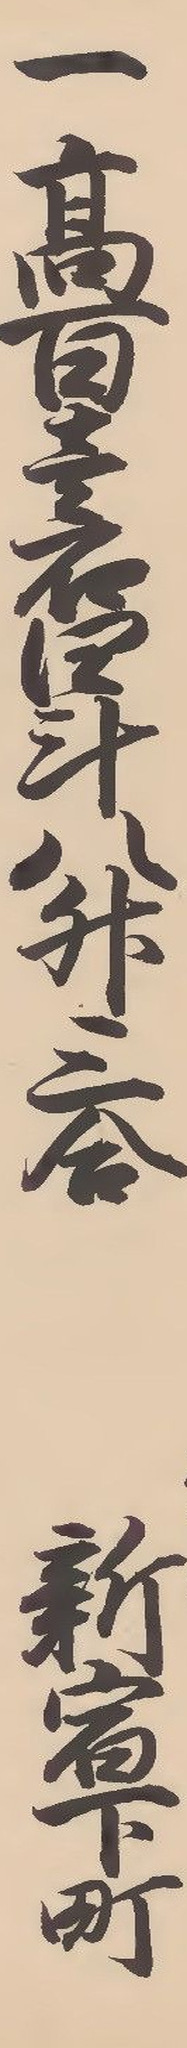一高百壱石四斗八升三合新宿下町
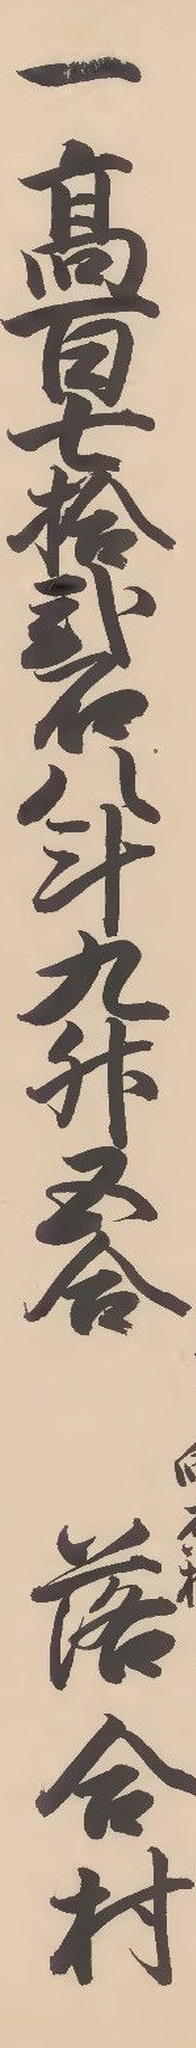一高百七拾弐石八斗九升五合落合村
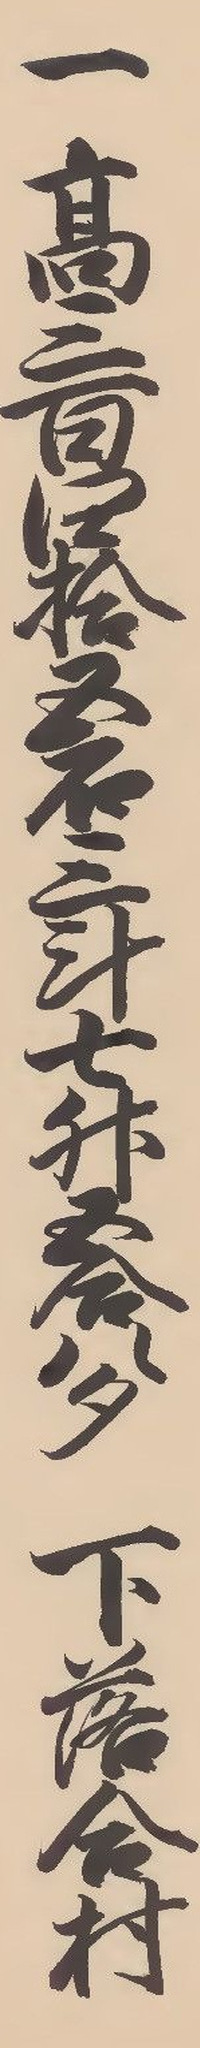一高三百四拾五石三斗七升五合八勺下落合村
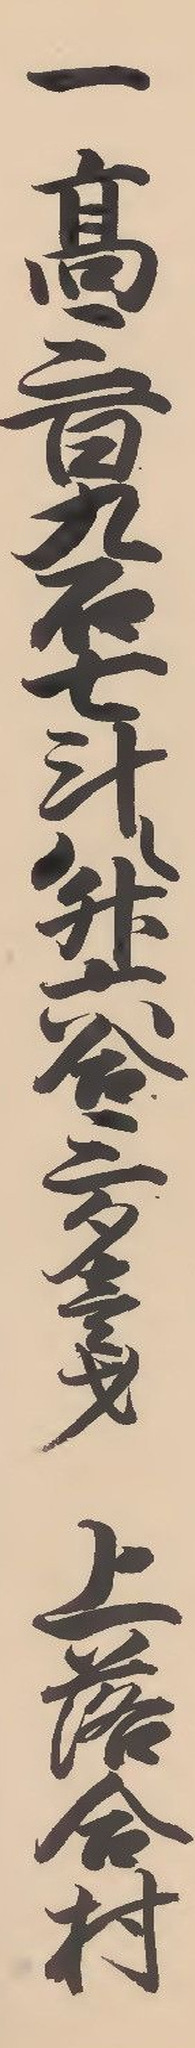一高三百九石七斗八升六合三勺壱才上落合村
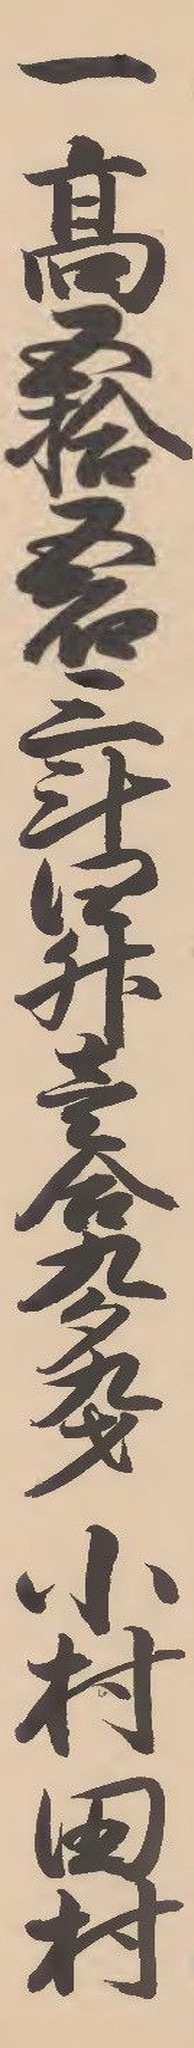一高五拾五石三斗四升壱合九勺九才小村田村
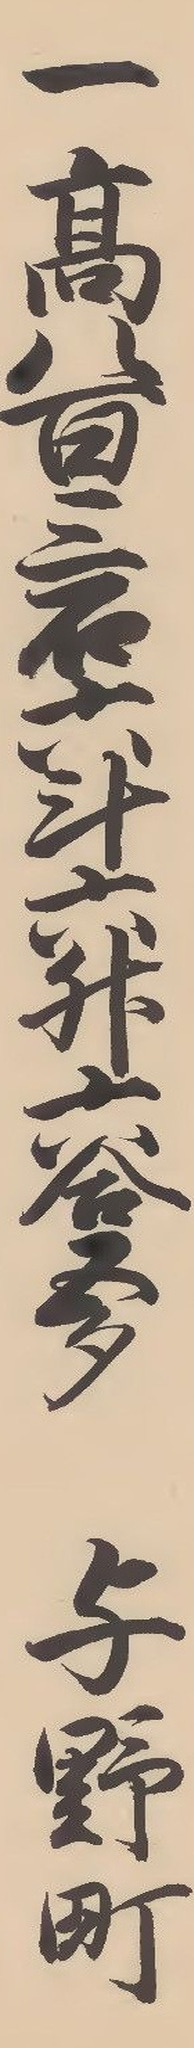一高八百三石六斗六升六合五勺与野町
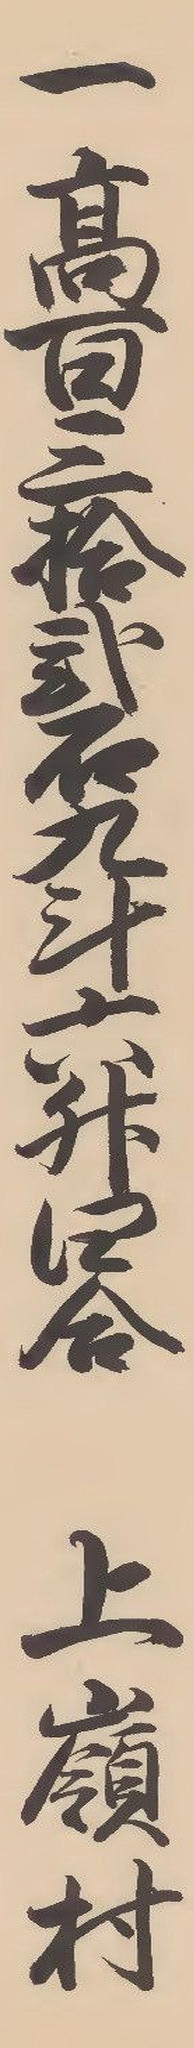一高百三拾弐石九斗六升四合上嶺村
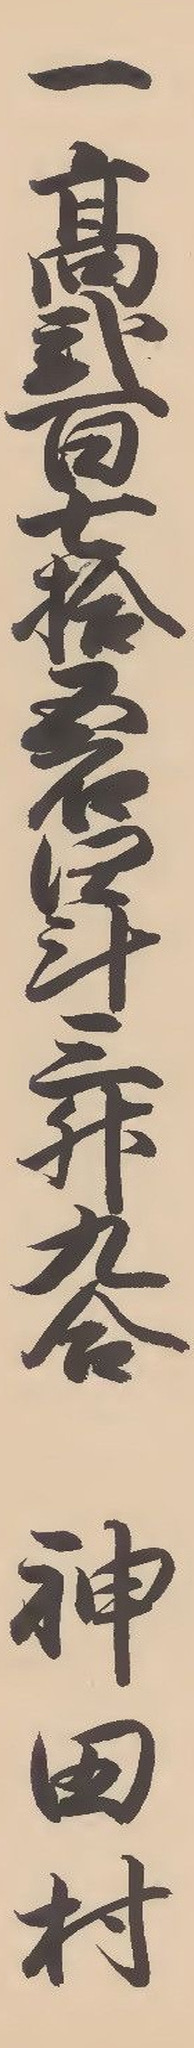一高弐百七拾五石四斗三升九合神田村

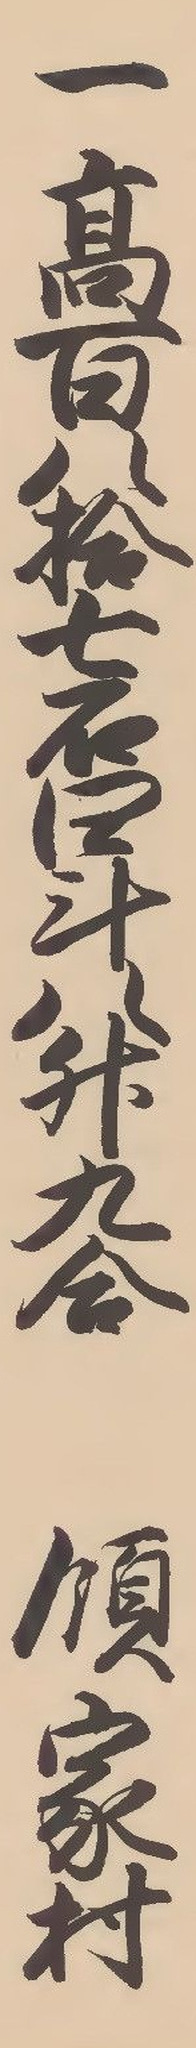一高百八拾七石四斗八升九合領家村
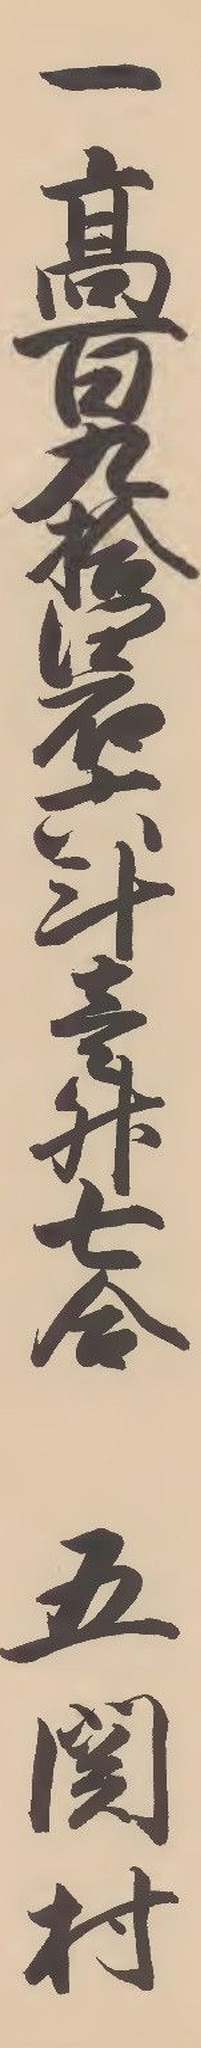一高百九拾四石六斗壱升七合五関村
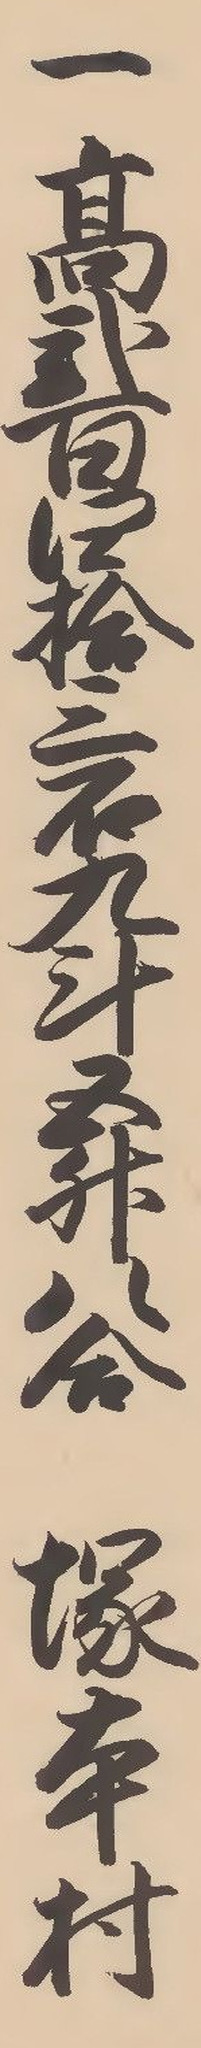一高弐百四拾三石九斗五升八合塚本村
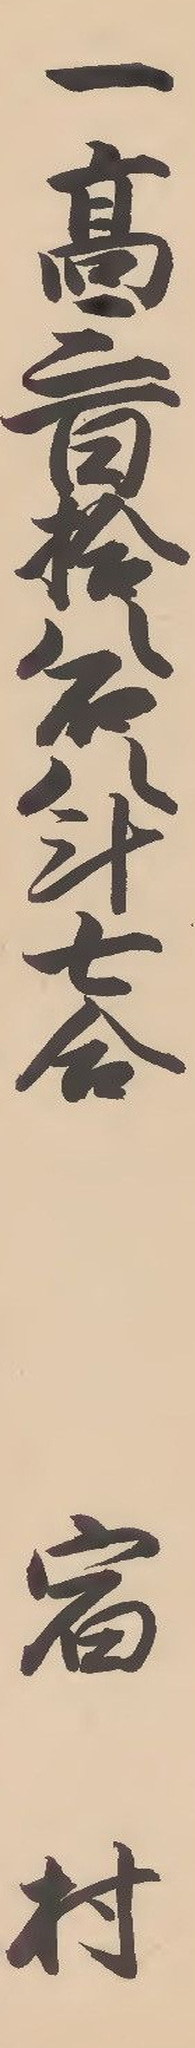一高三百拾八石八斗七合宿村
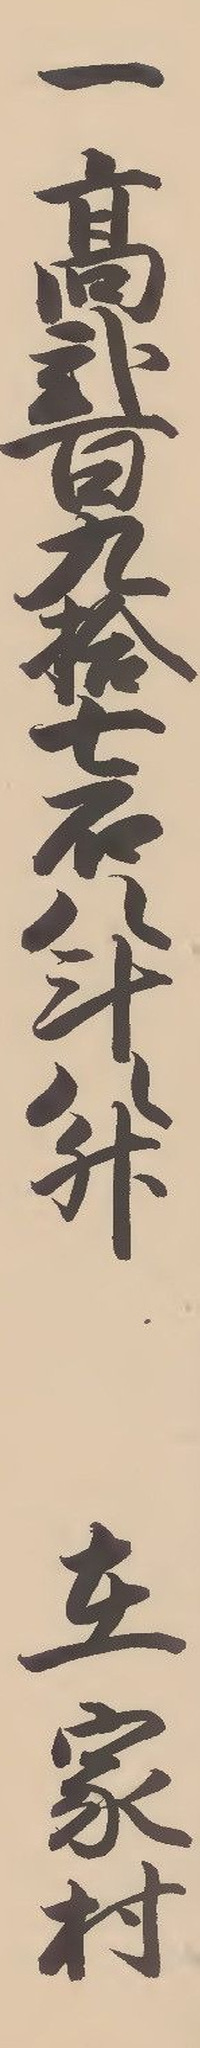一高弐百九拾七石八斗八升在家村
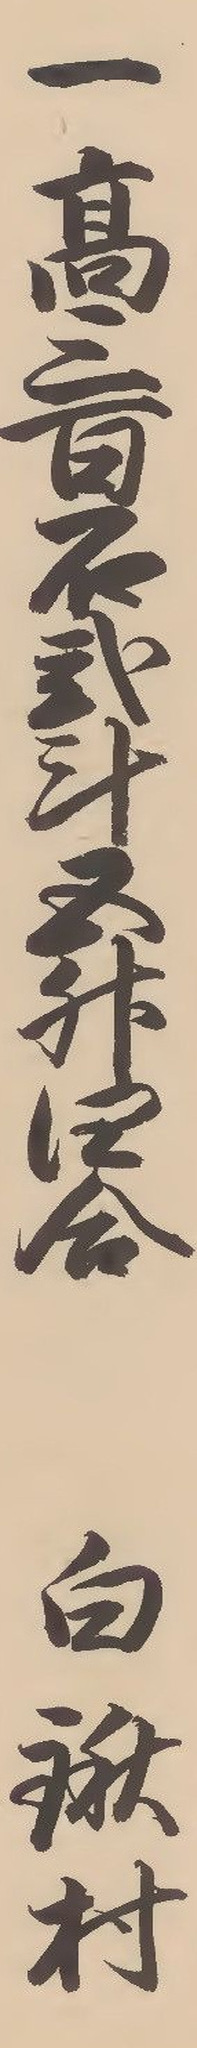一高三百石弐斗五升四合白鍬村
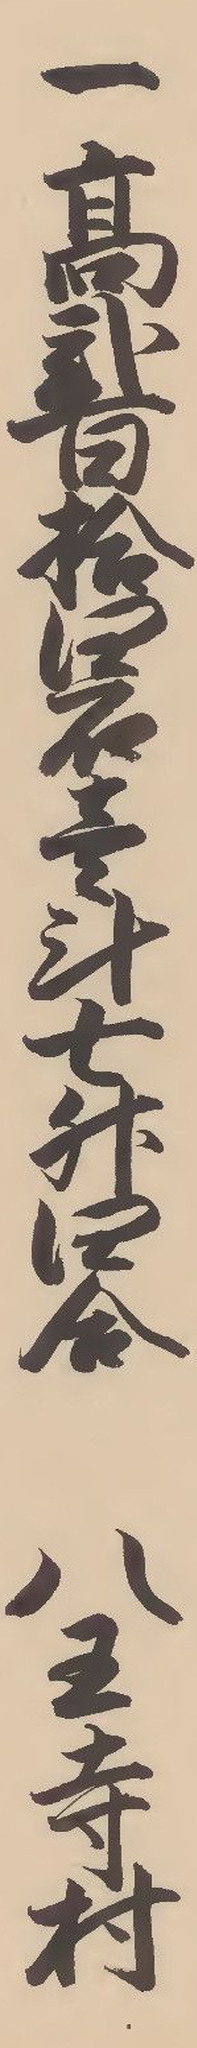一高弐百拾四石壱斗七升四合八王寺村
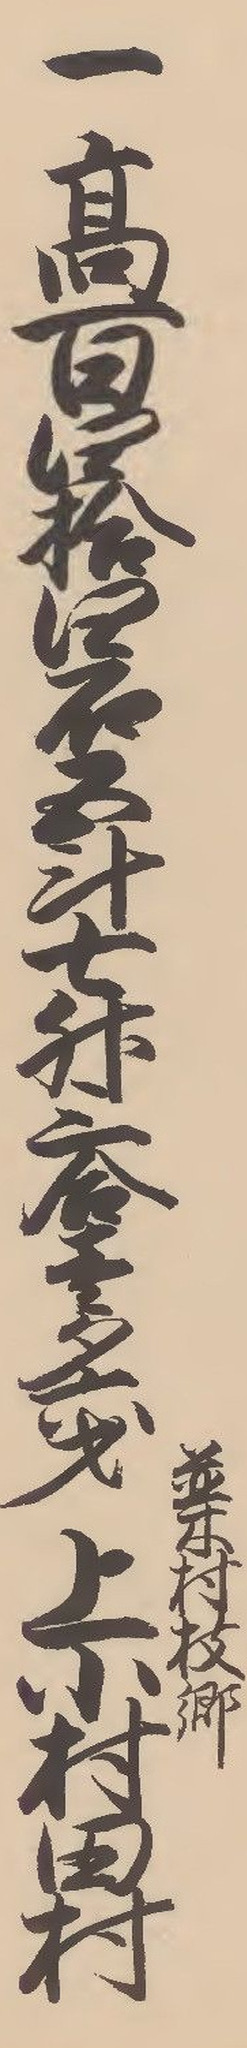一高百四拾四石五斗七升三合壱勺六才上小村田村
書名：武蔵国郷帳　下
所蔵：国立公文書館 National Archives of Japan
